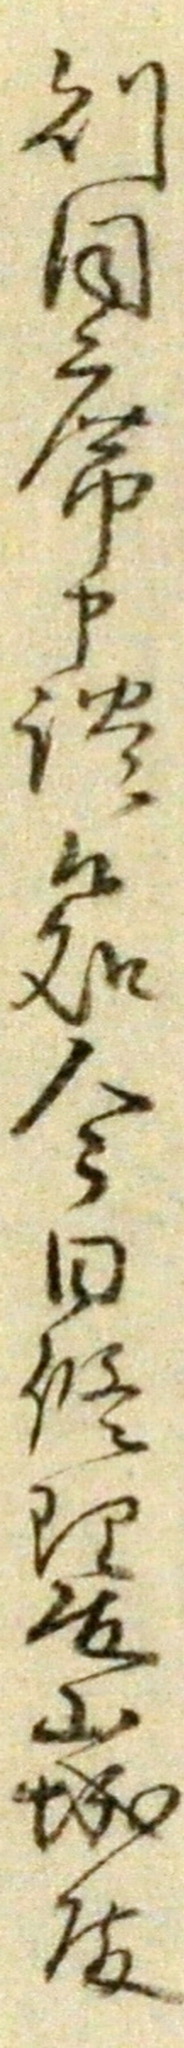則同席申談候処今日修理殿山城殿
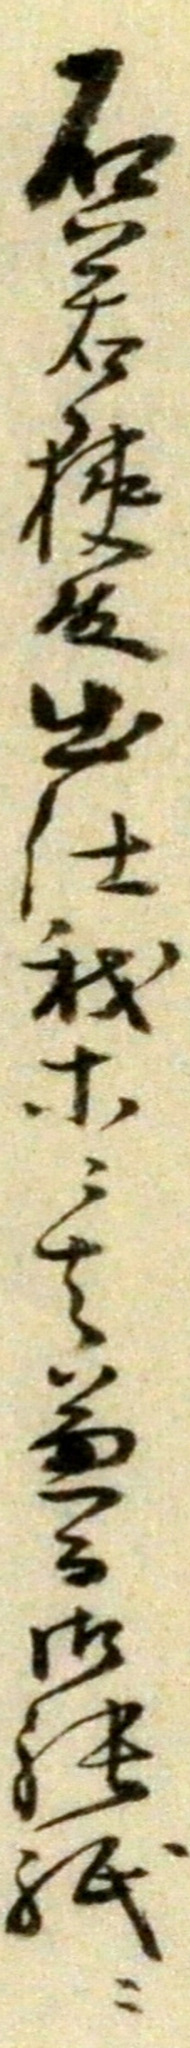石若狭殿出仕我等ニは兼而御張紙ニ
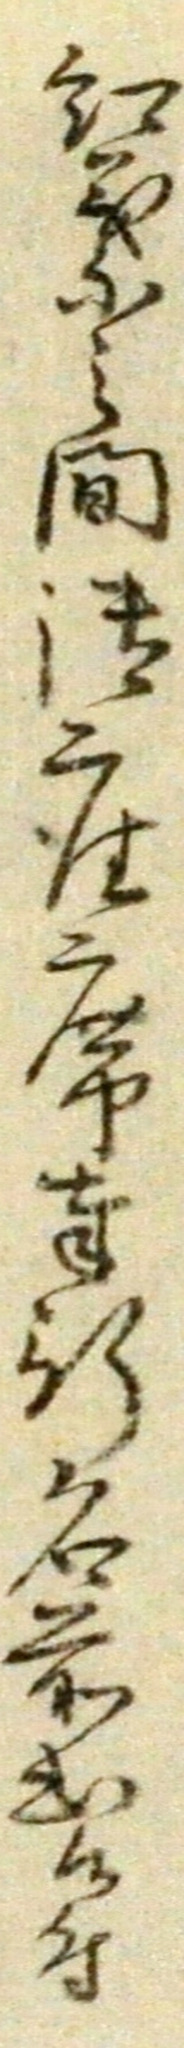紅葉之間御座席奉行名前出候付
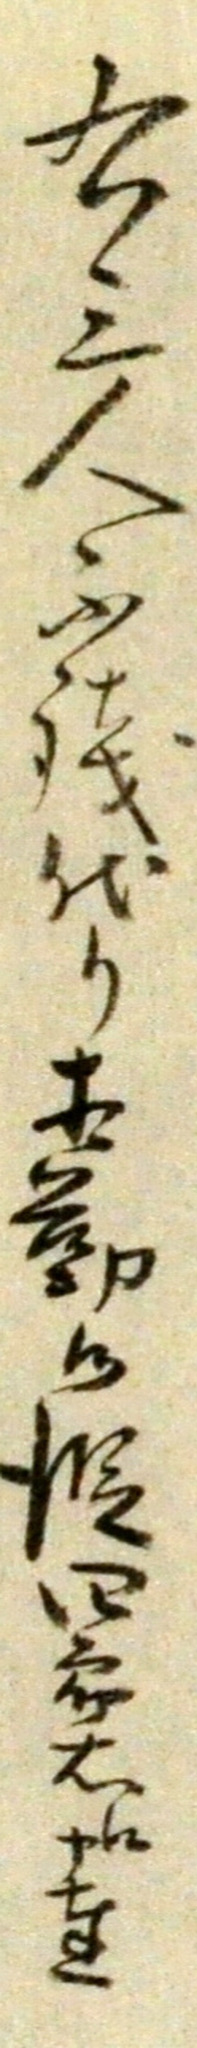右三人不残代り相勤候段四郎右え申達
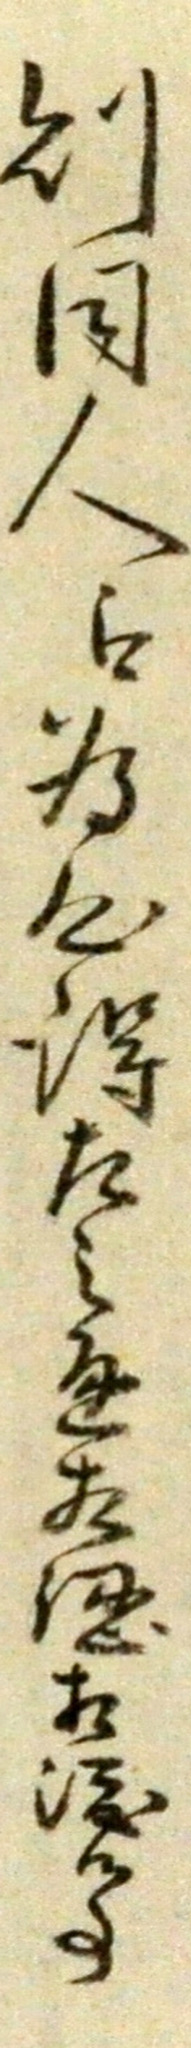則同人え為心得左之通相認相渡候事
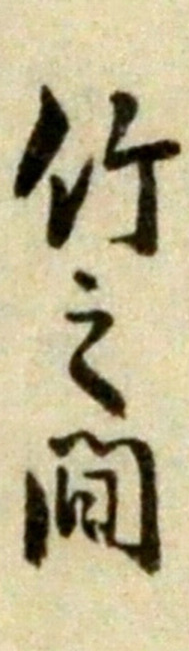竹之間
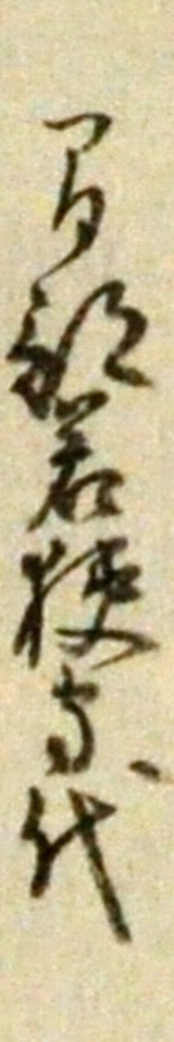間部若狭守代
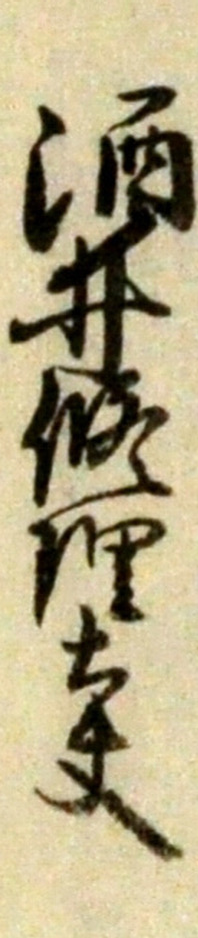酒井修理大夫
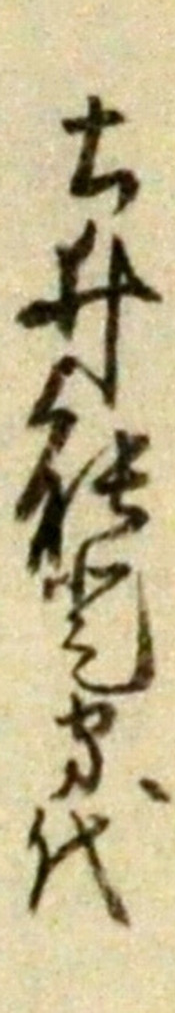土井能登守代

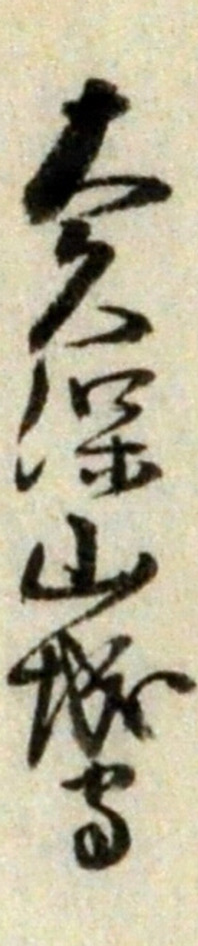大久保山城守
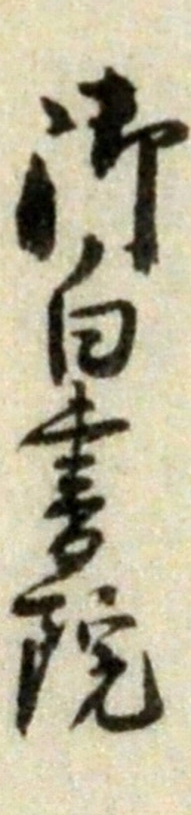御白書院
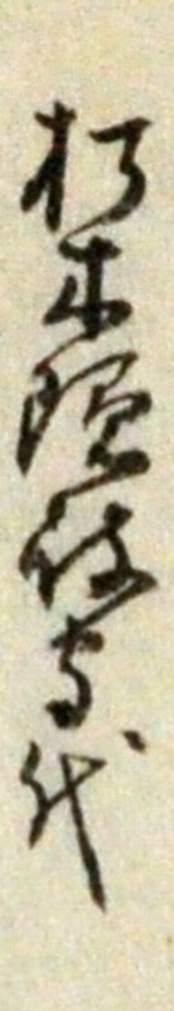朽木隠岐守代
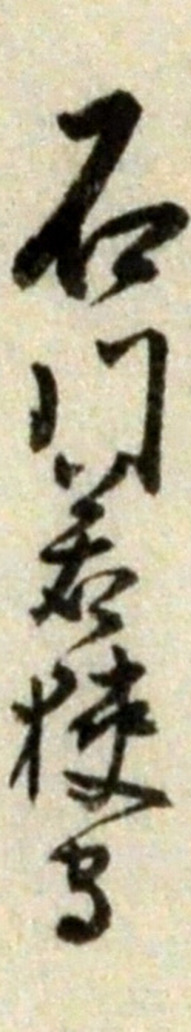石川若狭守
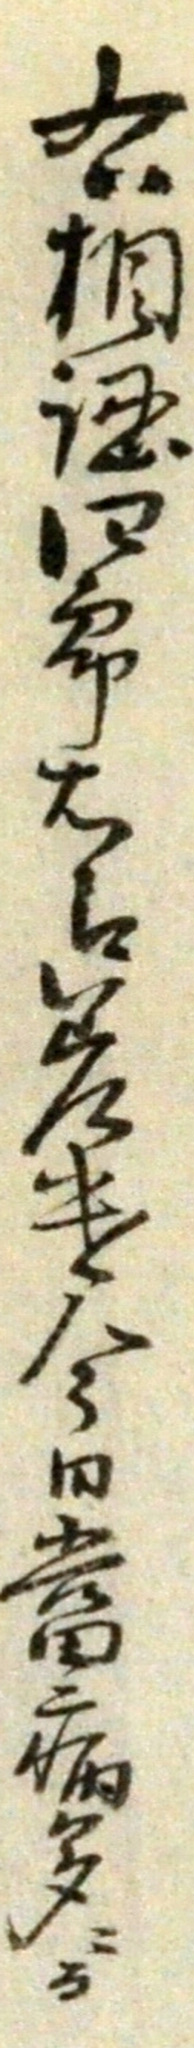右相認四郎右え差遣今日當病多ニ而
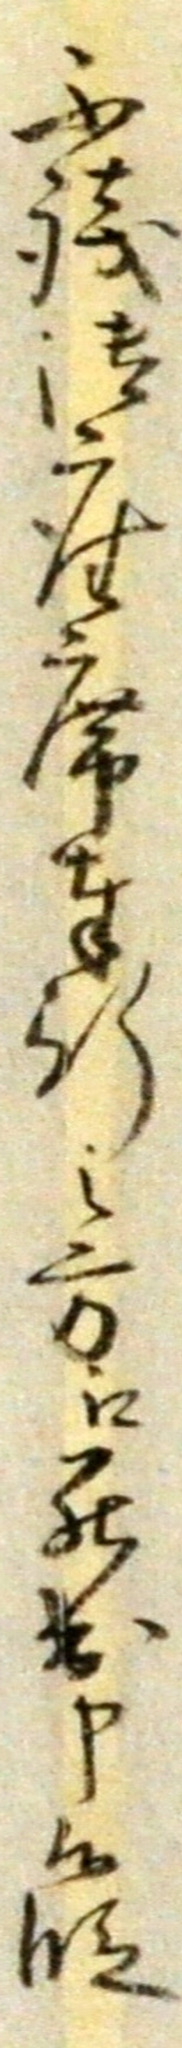不残御座席奉行之方え罷出申候段
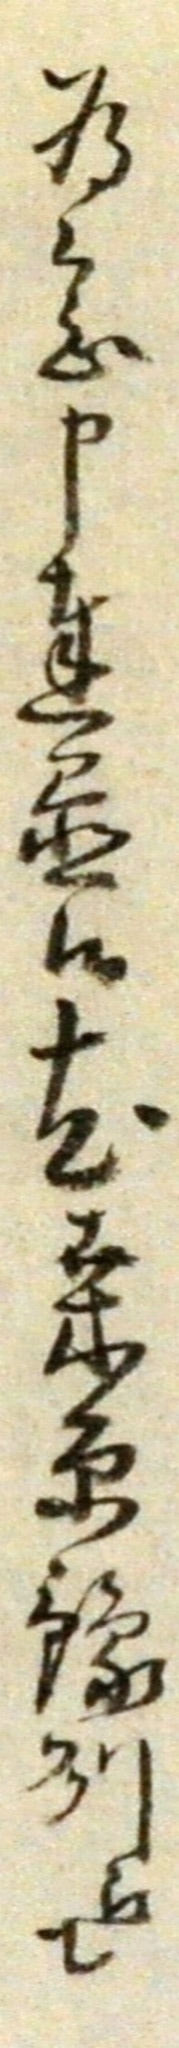為念申達置候尤桑原豫州えも
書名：若君様（家斉嫡男）誕生諸祝儀ノ節ノ留書外
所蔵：伊那市立高遠町図書館・合同会社AMANE
